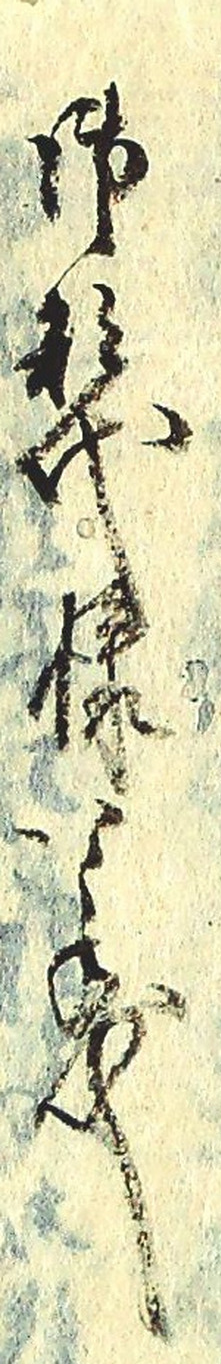御郡代様御手代
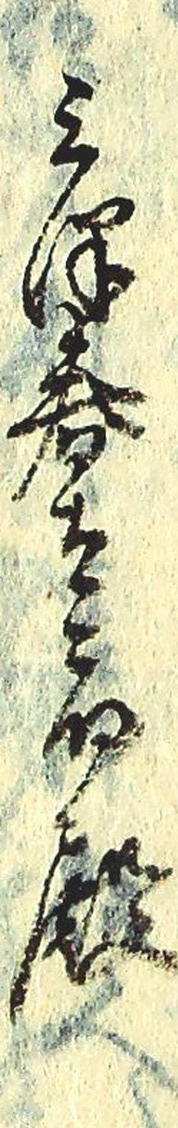三沢春太郎殿
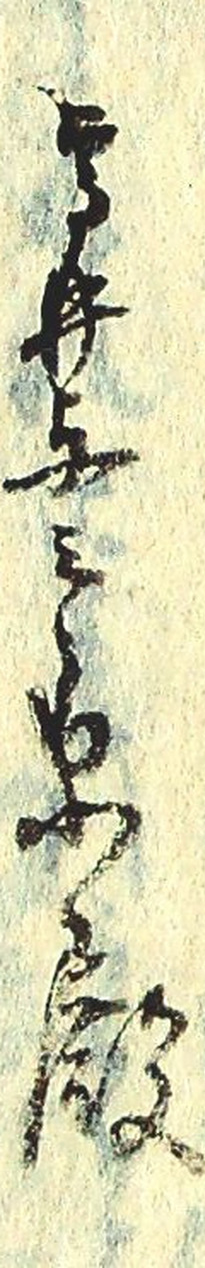高井与三兵衛殿
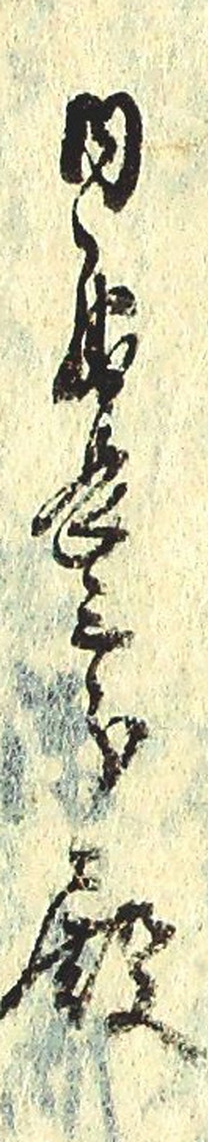内藤長三郎殿
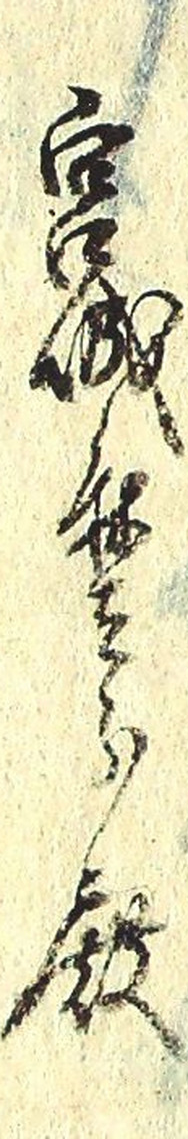宮城麻太郎殿
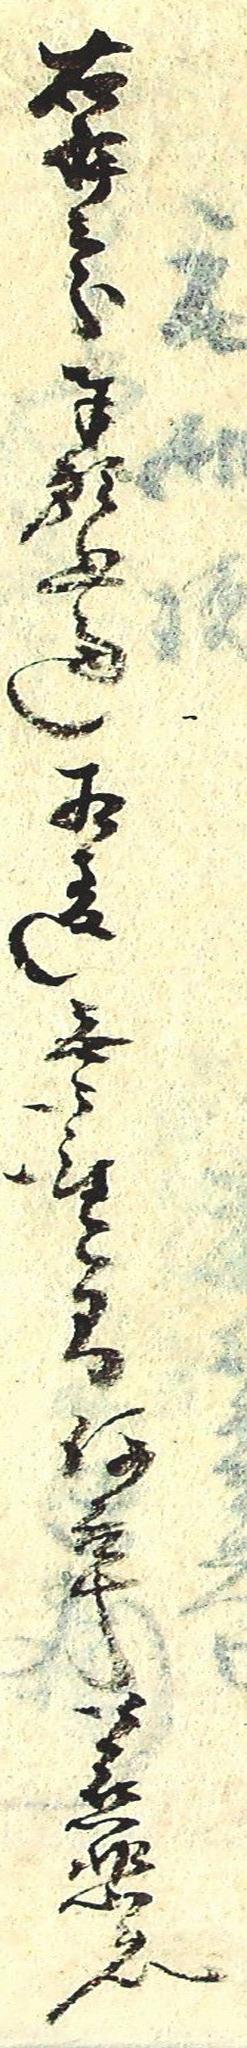右伊三郎奉願上通相違無御座候間何卒御慈悲を以
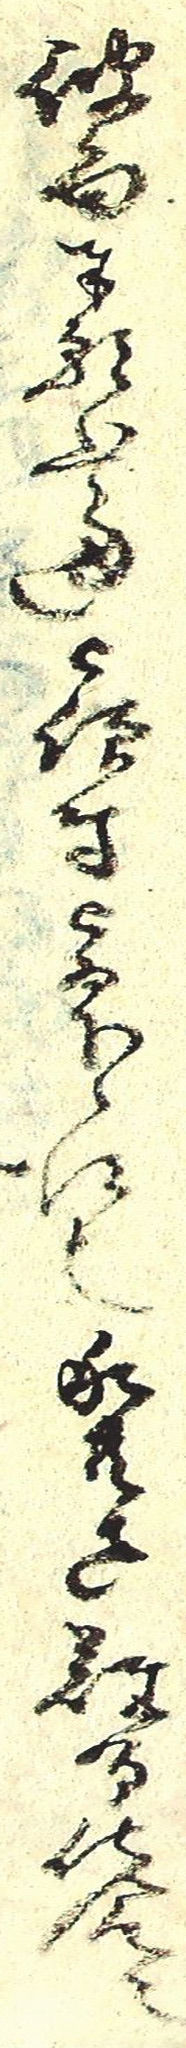彼者奉願上通被仰付被為下候得は私共迄難有仕合に
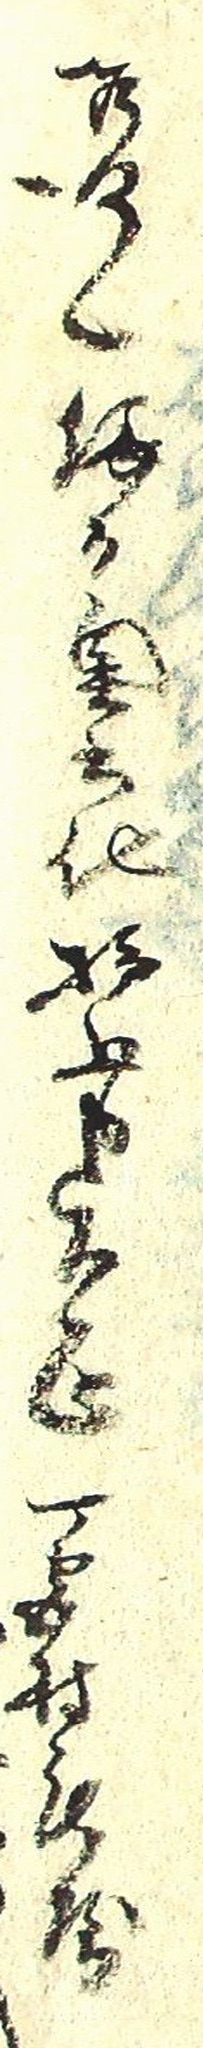奉存候依て奥書仕指上申候以上一ノ宮村庄屋

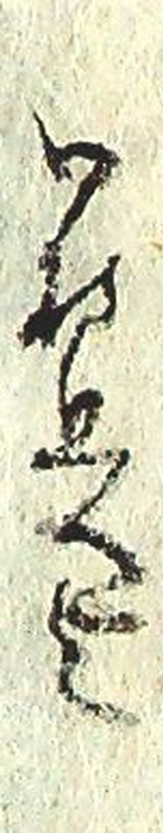同村五人与
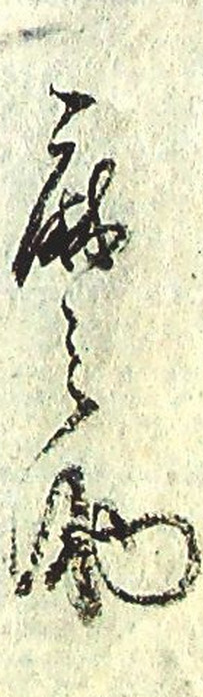麻之助
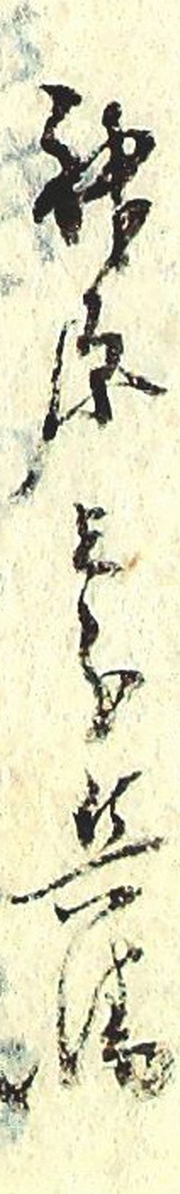同神原三郎兵衛
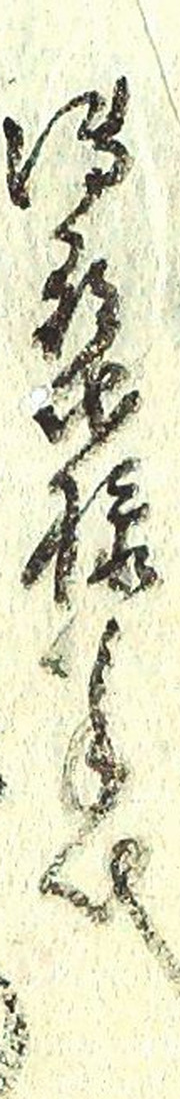御郡代様御手代
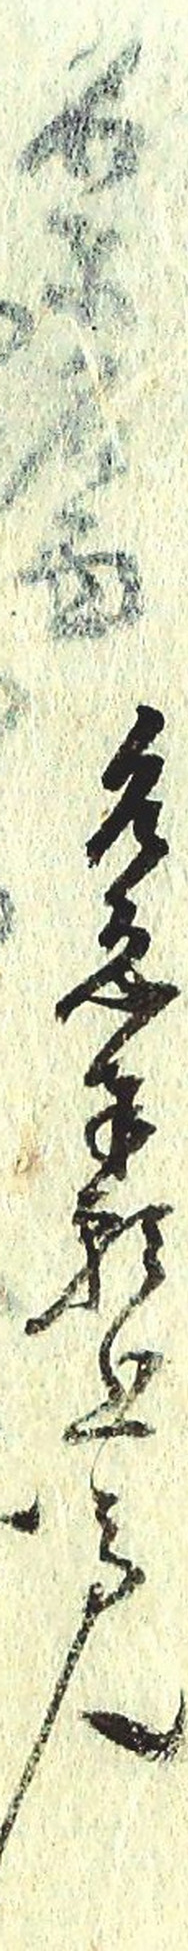乍恐奉願上覚
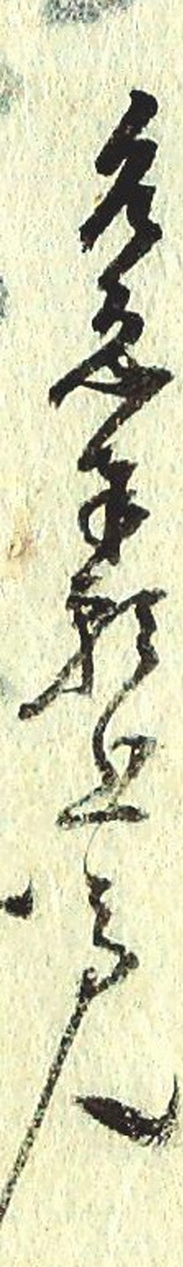乍恐奉願上覚
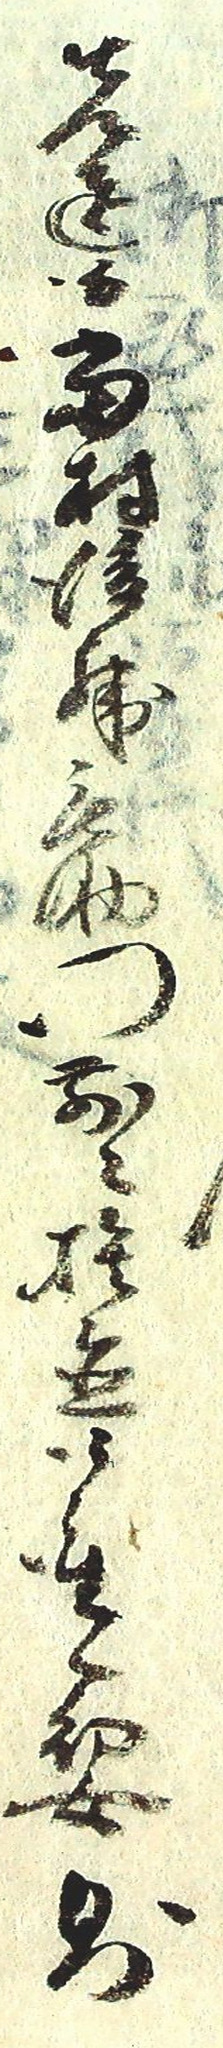先達て当村後藤庄助門前に捨置御座候幼女則
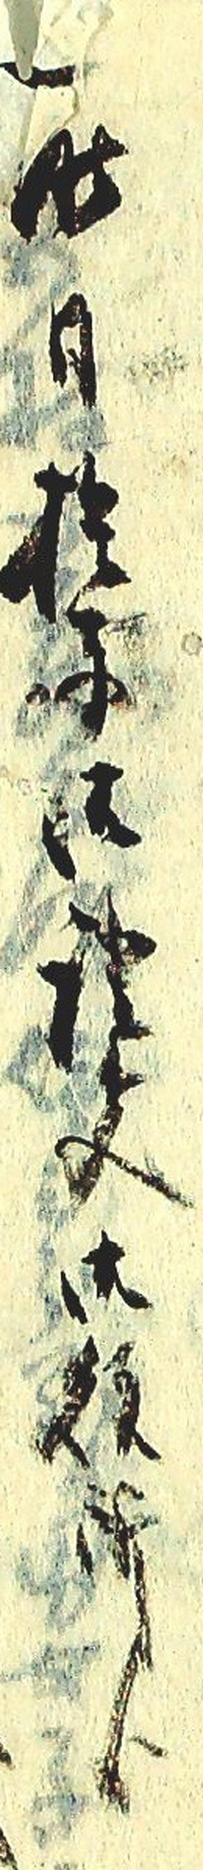一昨日捨子御証文御役所ゟ
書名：諸御願書控(弐番）
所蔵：鳴門教育大学 Naruto University of Education
